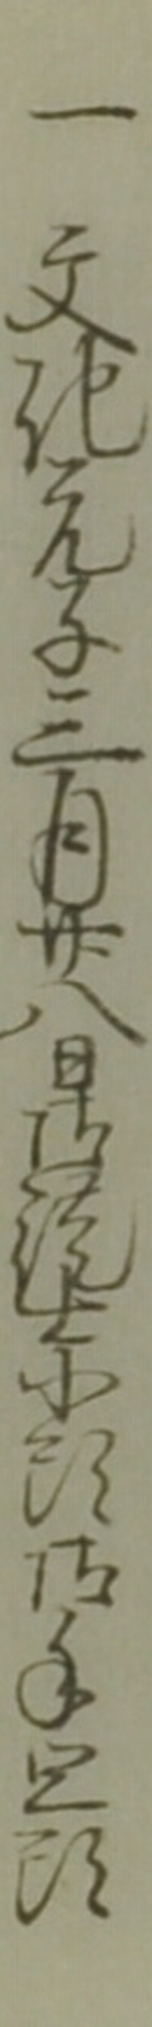一文化元子三月廿八日御徒士小頭御手廻頭
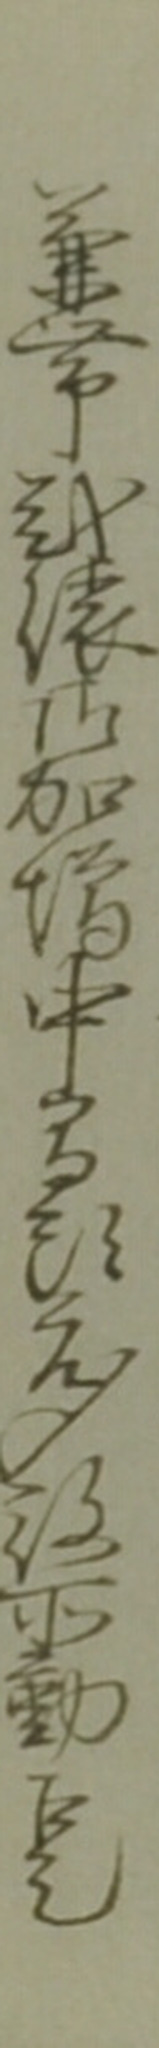兼帯弐俵御加増中間頭元〆役所勤是
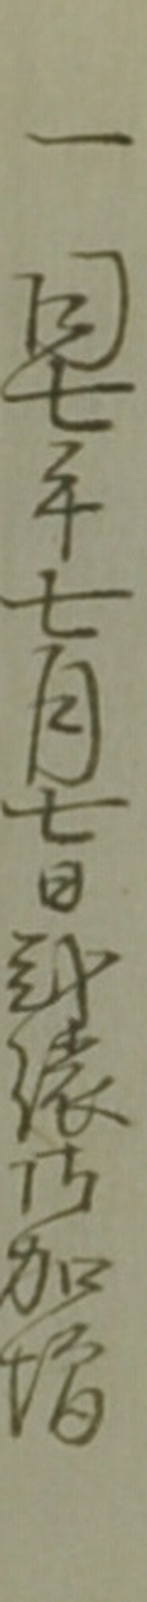一同七午七月七日弐俵御加増
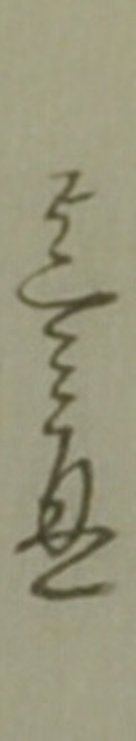迄之通
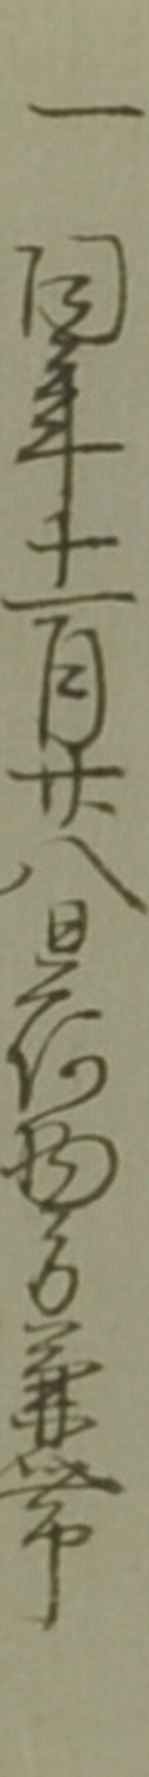一同年十一月廿八日荷物方兼帯
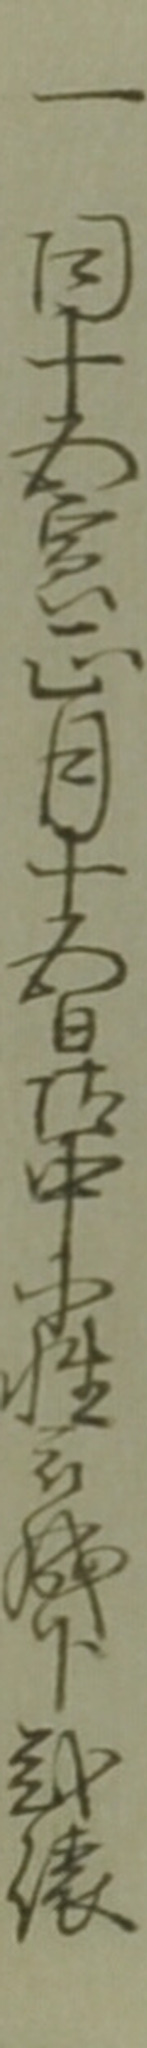一同十五寅正月十五日御中小性被成下弐俵
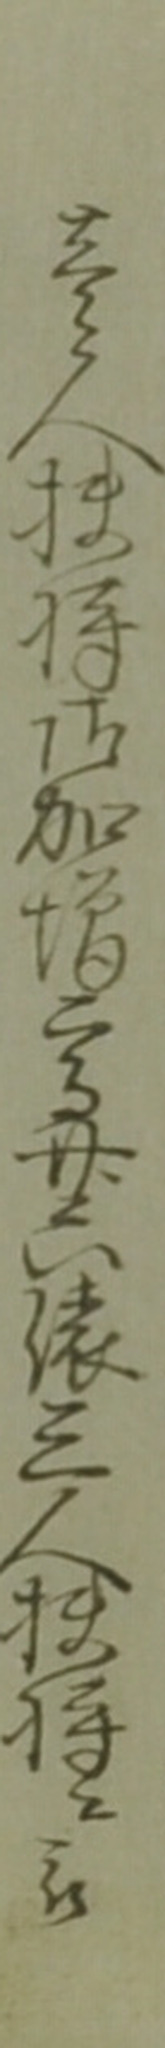壱人扶持御加増高廿六俵三人扶持ニ被
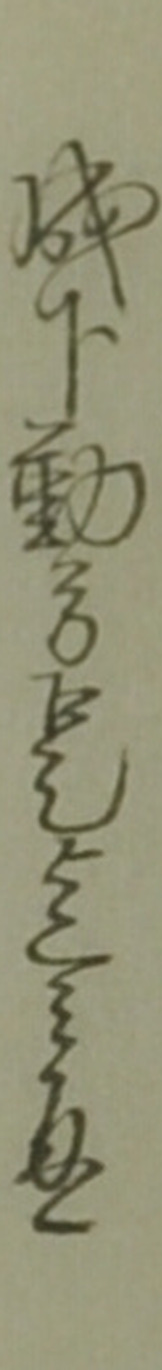成下勤方是迄之通
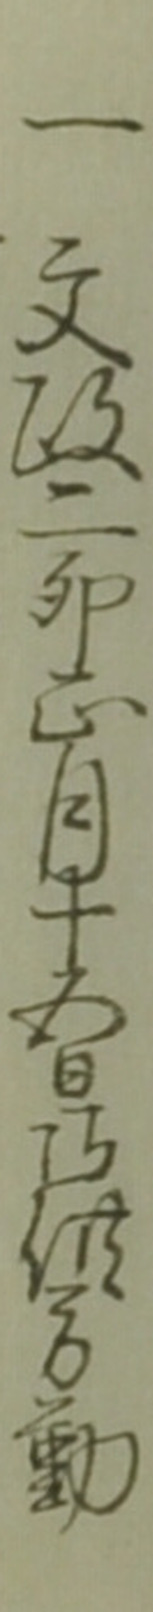一文政二卯正月十五日御供方勤
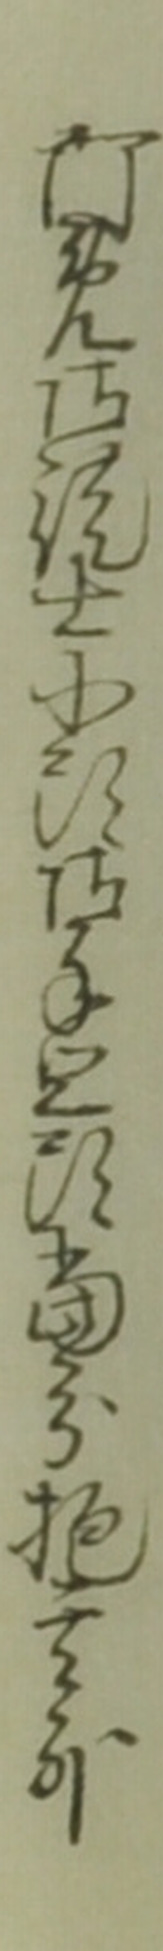御免御徒士小頭御手廻頭当分抱其外

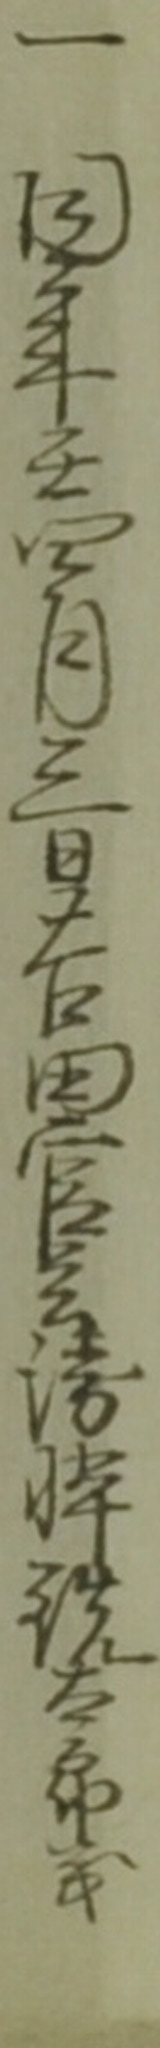一同年閏四月三日吉田官兵衛忰銑太郎義
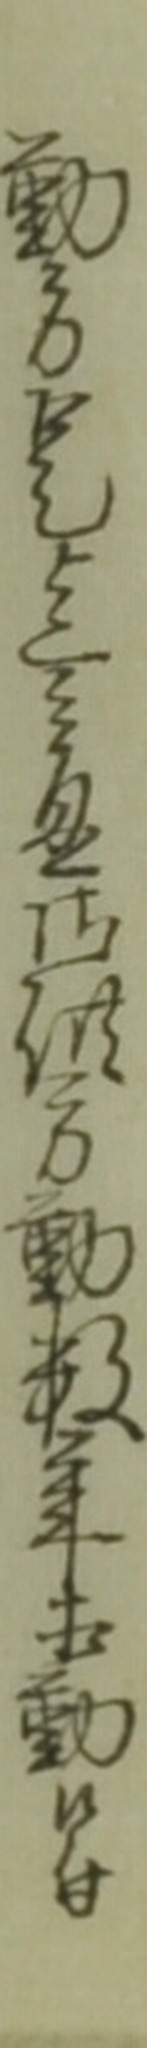勤方是迄之通御供方勤数年相勤候付
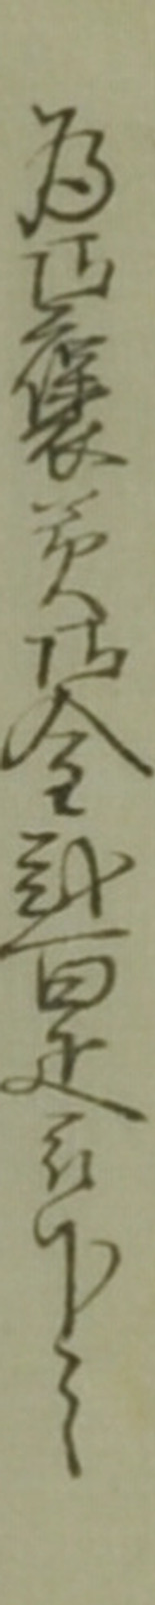為御褒美御金弐百疋被下之
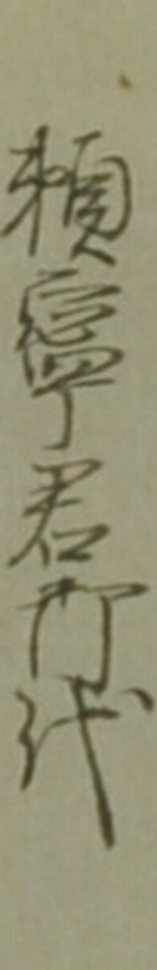頼寧君御代
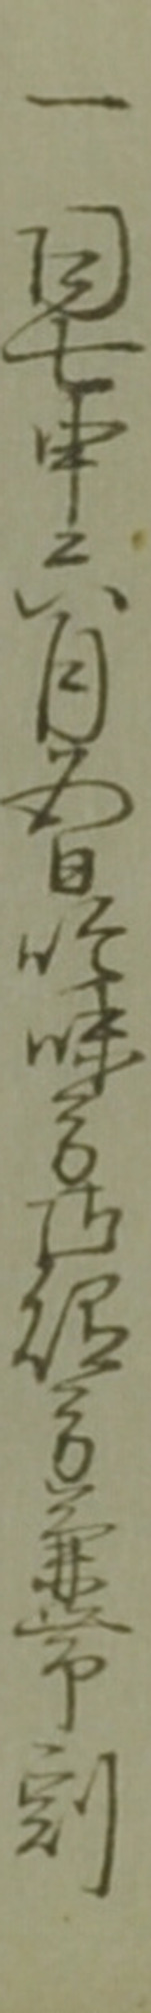一同七申六月五日吟味方御賄方兼帯割
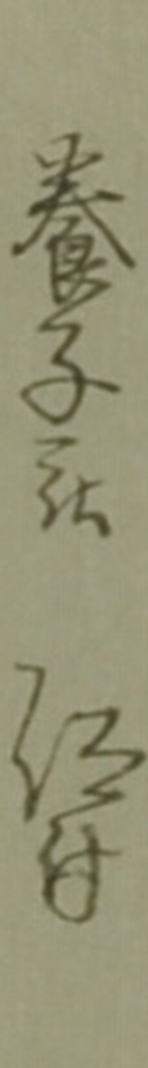養子被仰付
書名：無足諸士勤仕録（一）
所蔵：伊那市立高遠町図書館・合同会社AMANE
